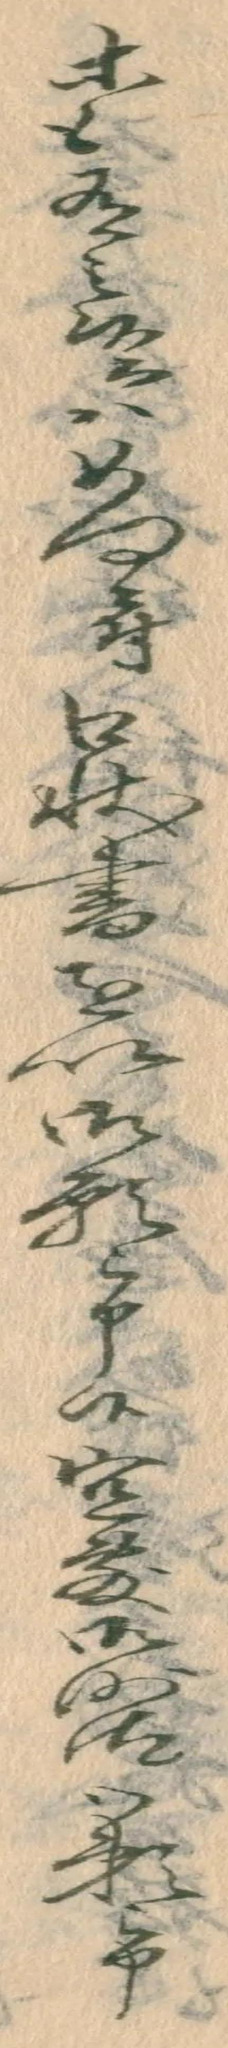等も有之候而ハ如何ニ付口状書を以御願被申候宜敷御沙汰御頼被申
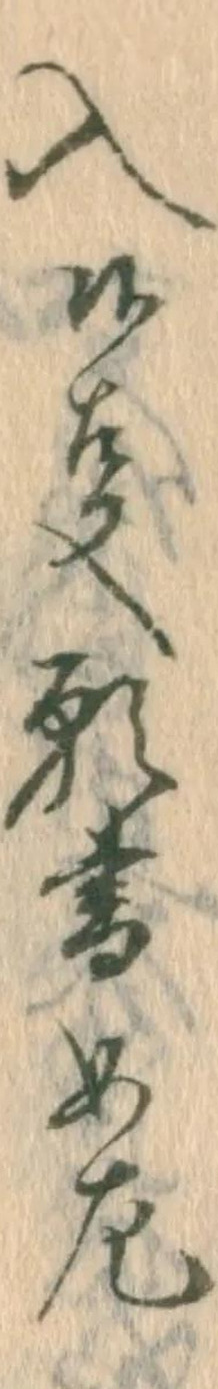入候事願書如左
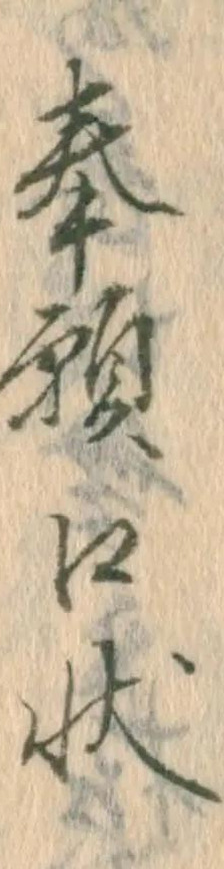奉願口状
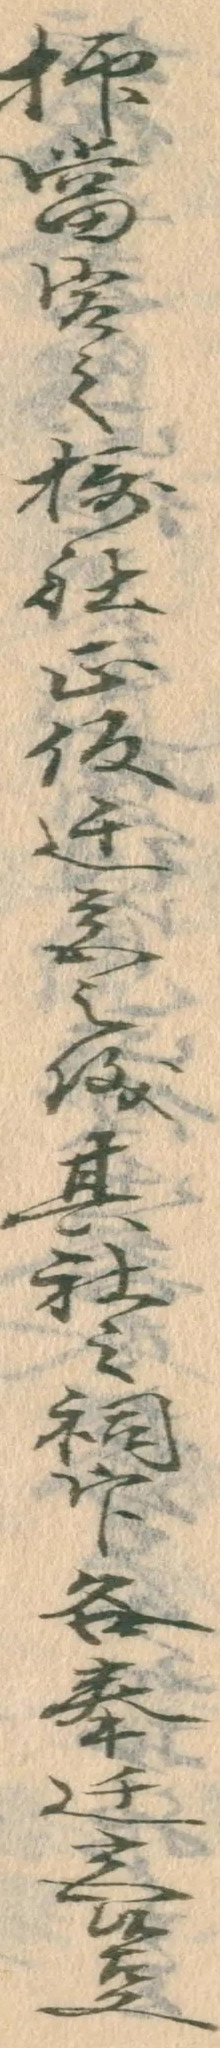仰当宮之摂社正仮迁宮之儀其社之祠官各奉迁宮候事
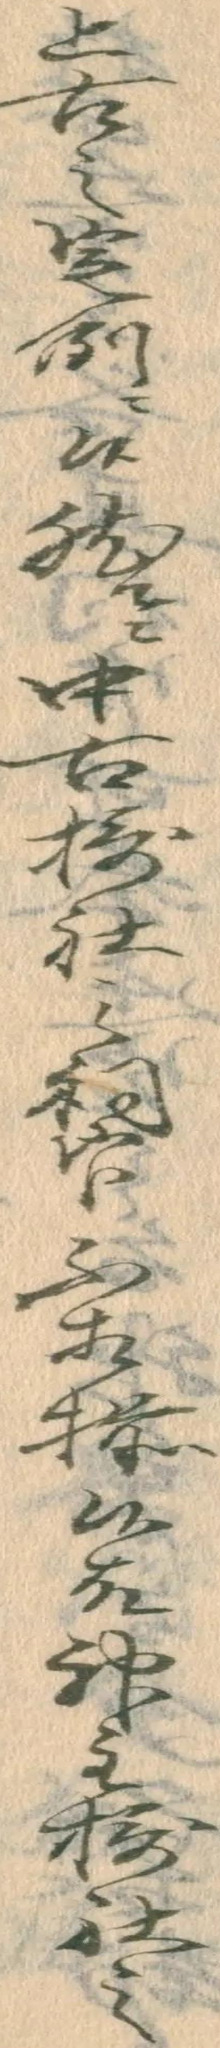上古之定例ニ候然ルニ中古摂社之祠官不相揃候故神主摂社之
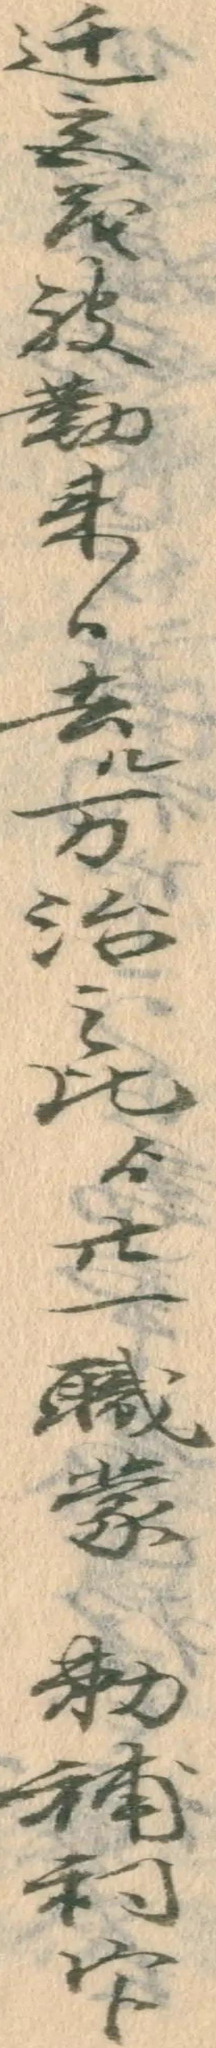迁宮茂被勤来候去ル万治之比ゟ廿一職蒙勅補祠官
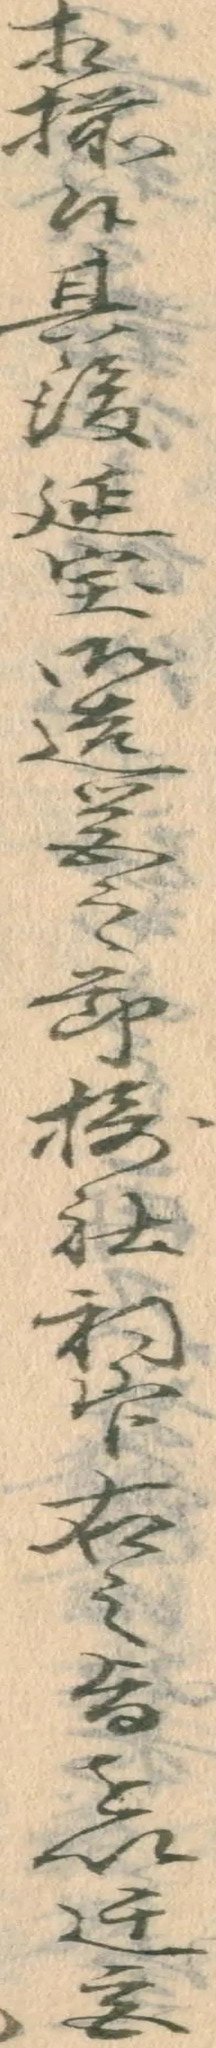相揃候其後延宝御造宮之節摂社祠官右之旨を以迁宮
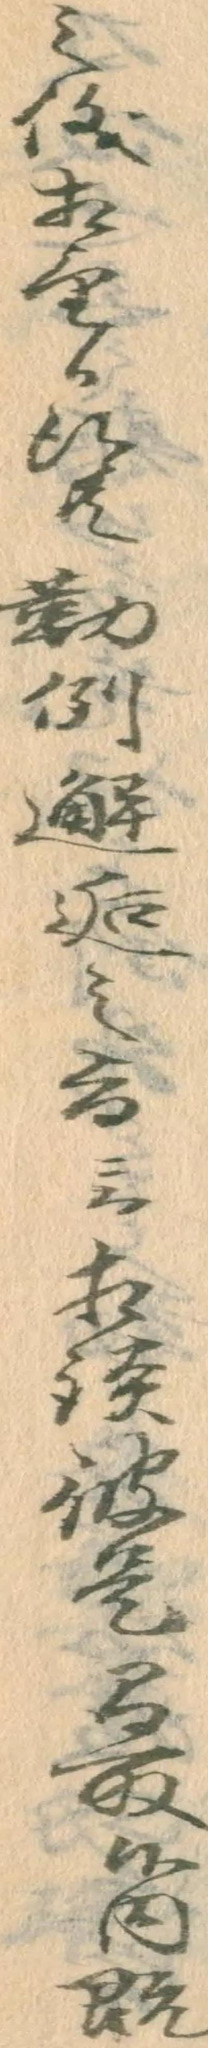之儀相望候得共勤例邂逅之旨ニ而相談彼是間取候内既

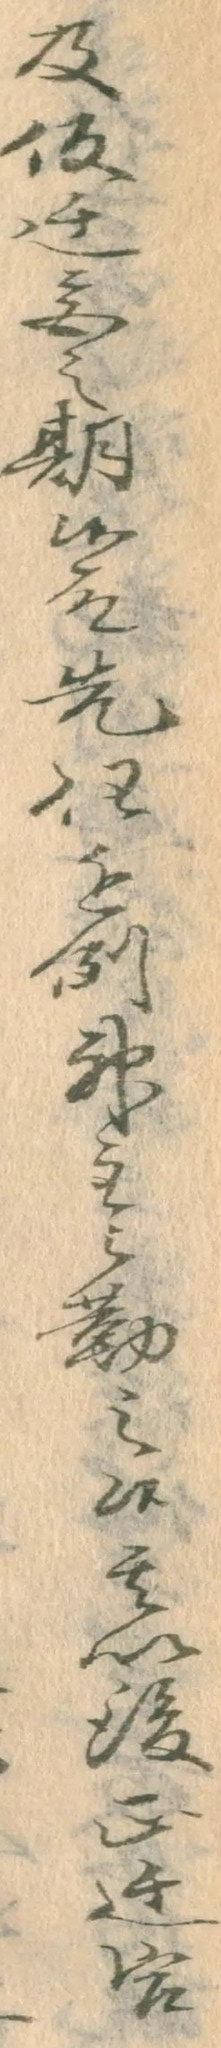及仮迁宮之期候故先任近例神主被勤之候其以後正迁宮
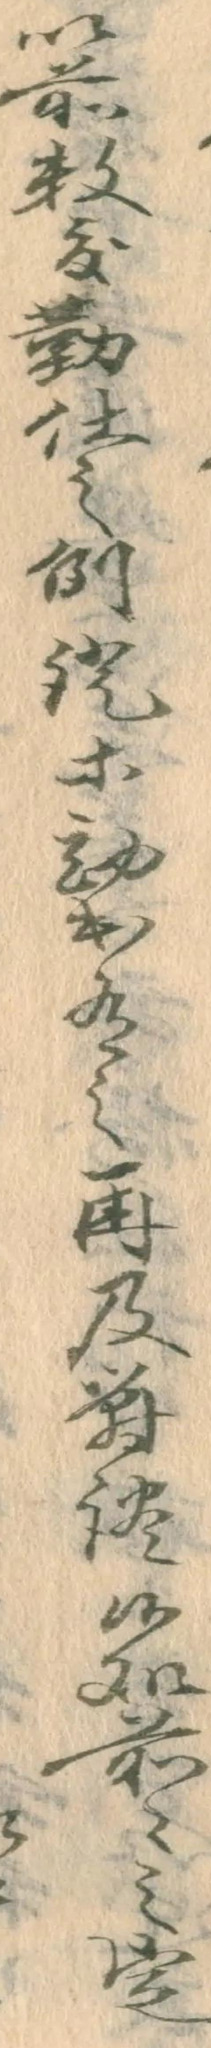以前数度勤仕之例証等勘出有之再及対談候処前々之定
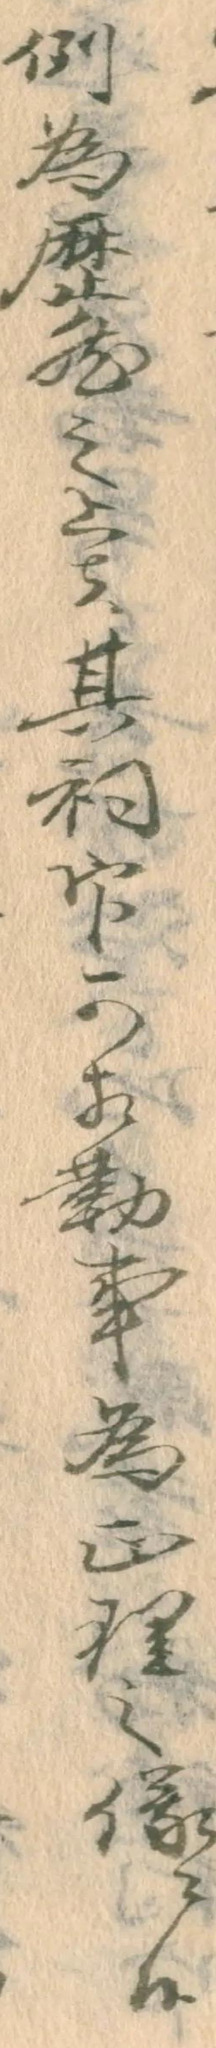例為歴然之上者其祠官可相勤事為正理之儀ニ候
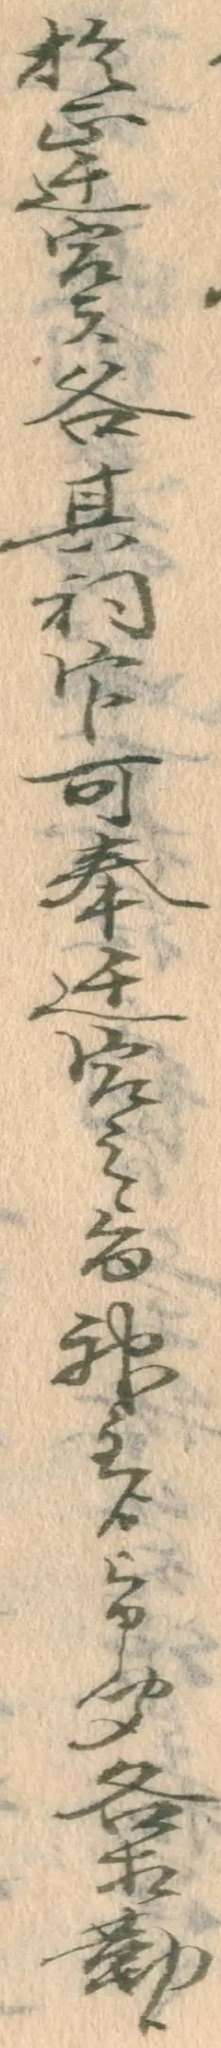於正迁宮は各其祠官可奉迁宮之旨神主ゟ被申聞各相勤候
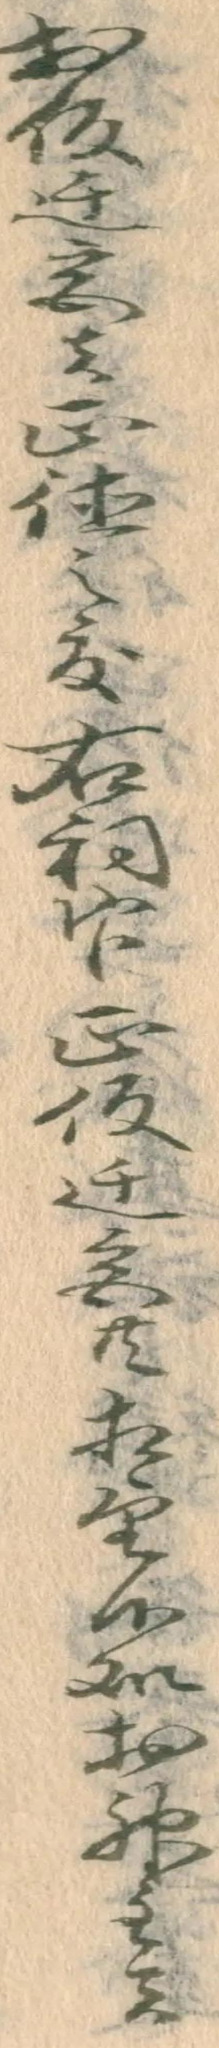於仮迁宮は正徳之度右祠官正仮迁宮共相望候処於神主は
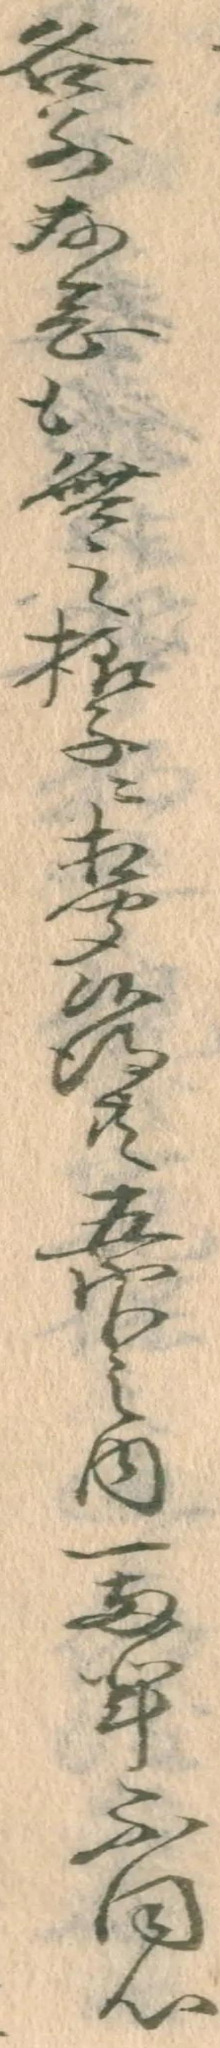各別存念も無之様子ニ相聞候得共五官之内一両輩不同心
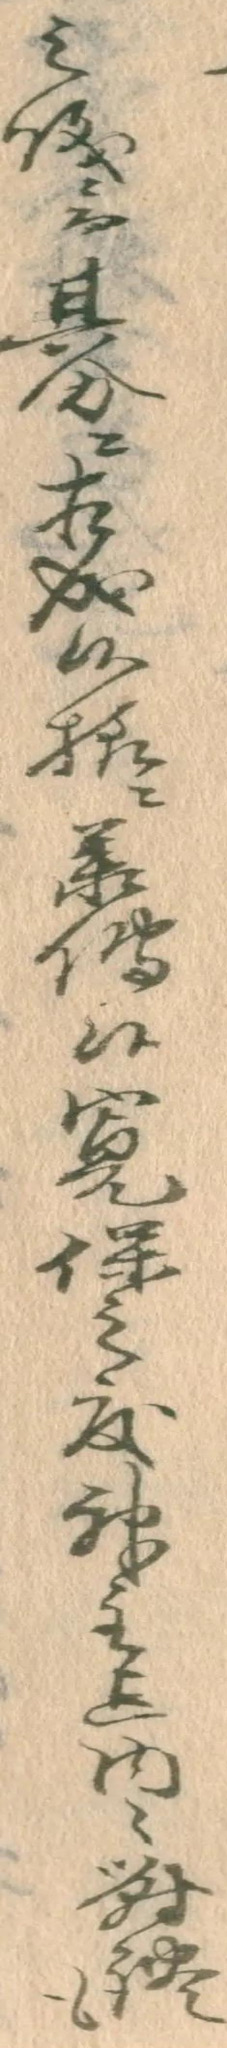之儀ニ而其分ニ相成候様ニ承伝候寛保之度神主迄内々対談も
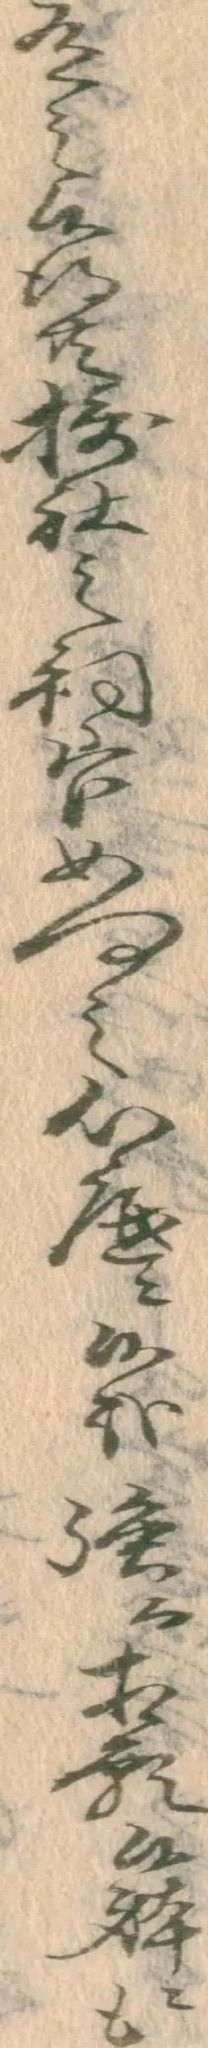有之候得共摂社之祠官如何之心底ニ候哉強而相願候体ニも
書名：賀茂社記録. 第17冊
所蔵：国立国会図書館 National Diet Library, JAPAN
